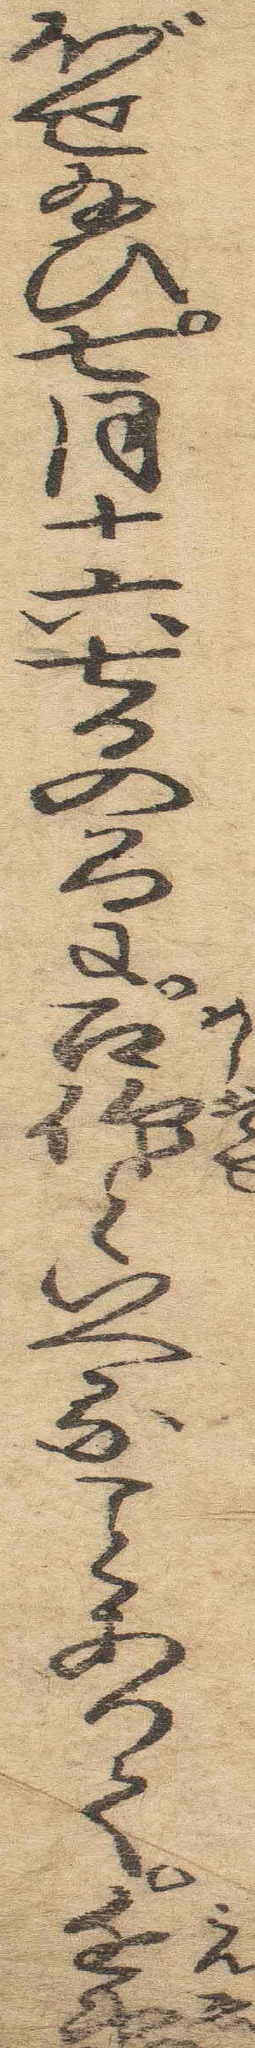ぼせ給ひ。七月十六七日の間に。召仰といへることありて。近衛
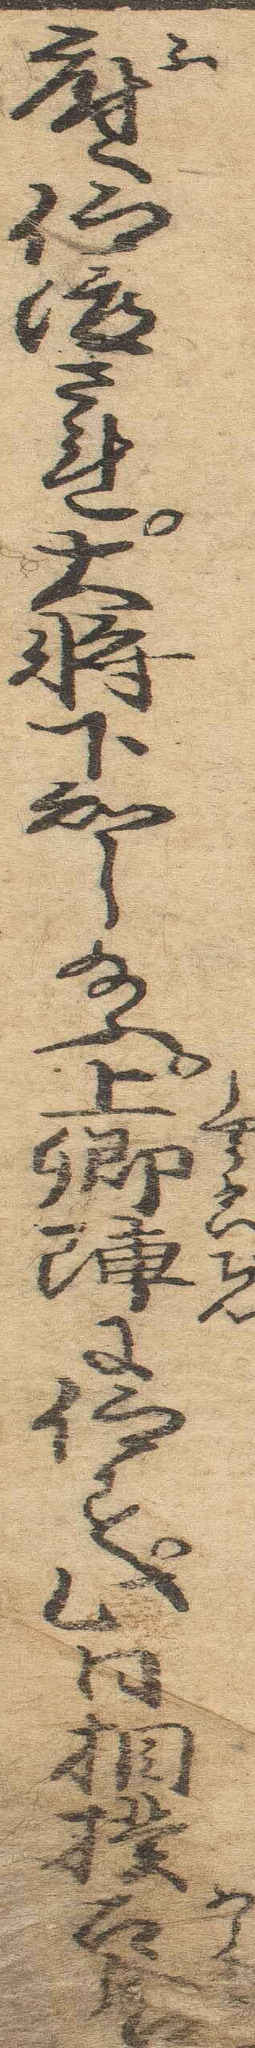府へ仰渡され。大将下知し給ふ。上卿陣に仰す。此日相撲召合
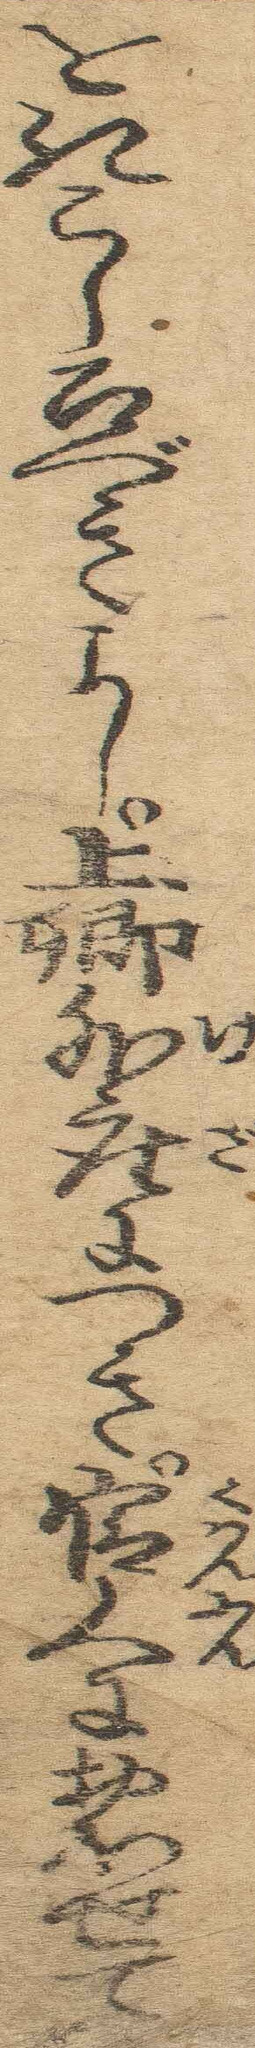をきこし召べきよし。上卿外座につき。官人におほせて膝突を
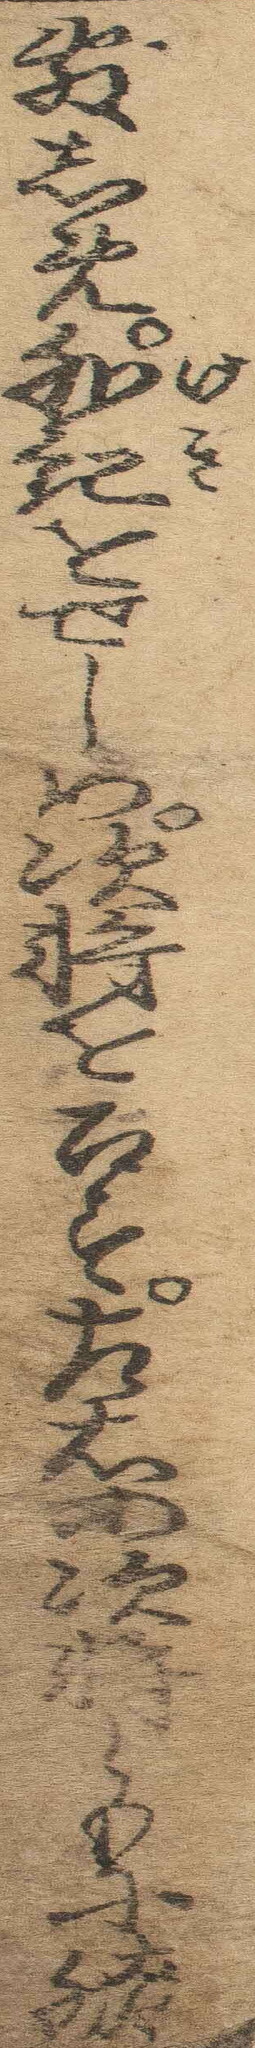敷しめ。外記をせしめ。次将を召す。左右の次将ともに膝突

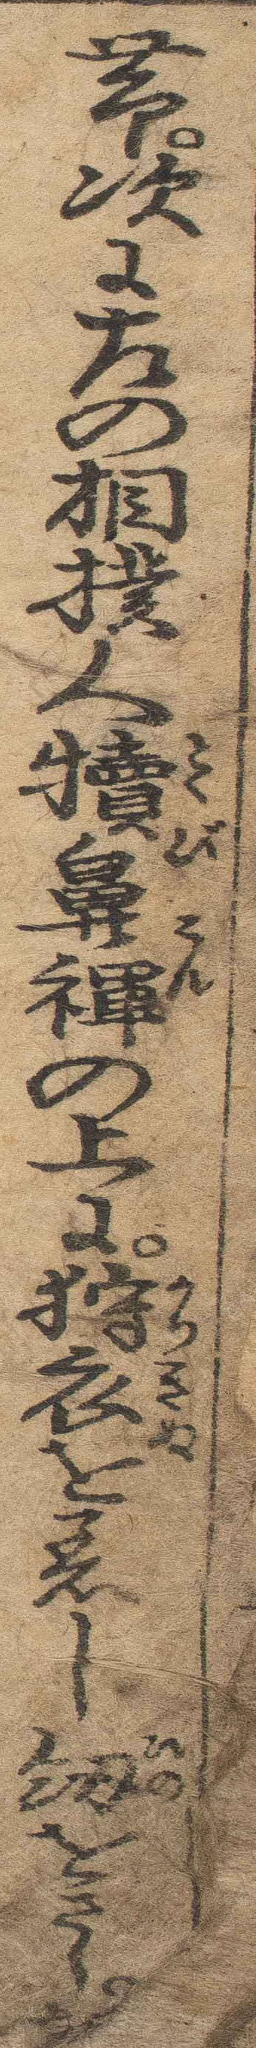帯。次に左の相撲人犢鼻褌の上に。狩衣を着し剱をさし。相
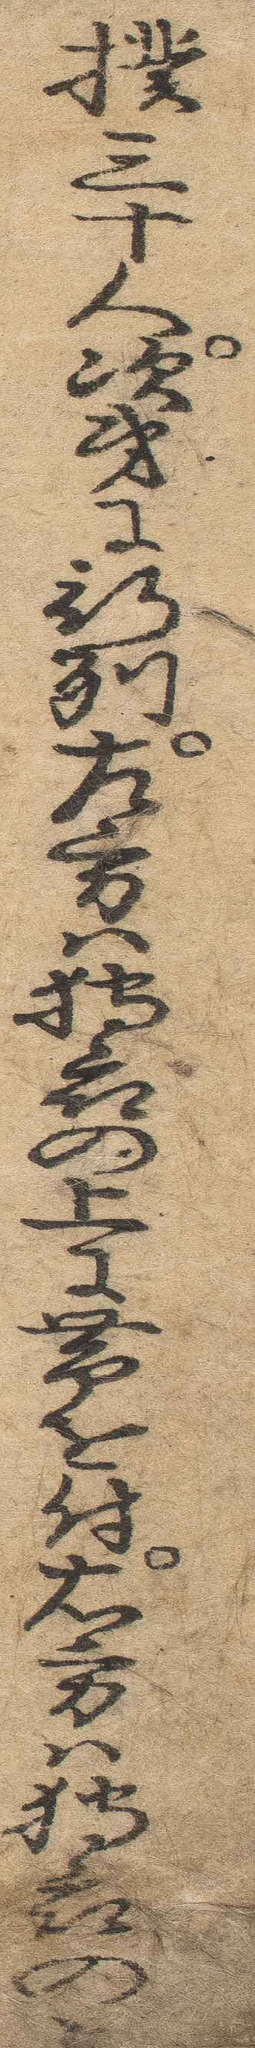撲三十人。次第に行列。左方は狩衣の上に帯を付。右方は狩衣の上
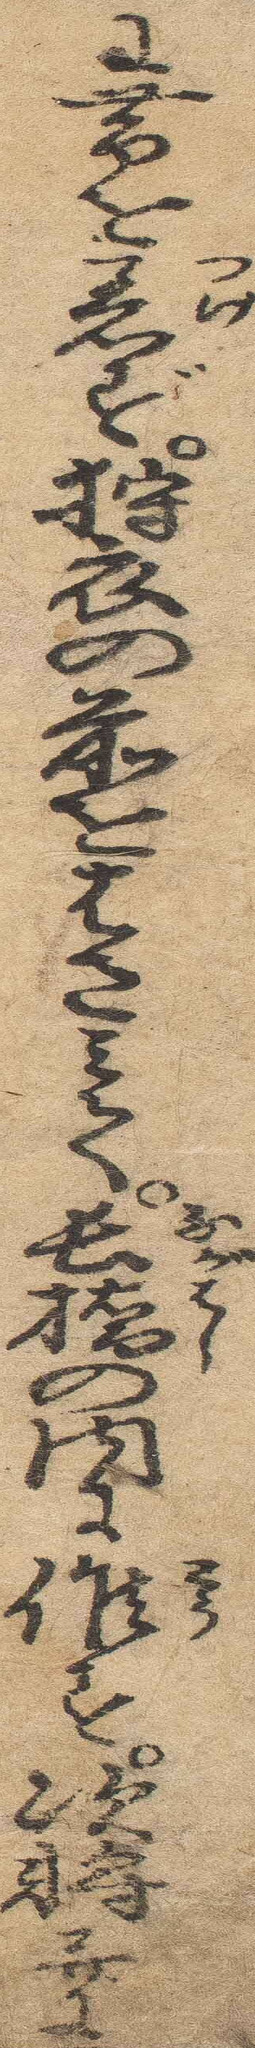に帯を着ず。狩衣の前をはさみて。長橋の内に候す。次将并に
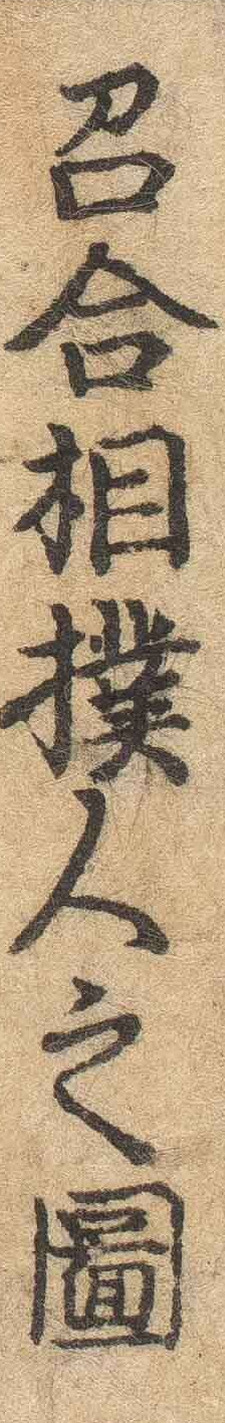召合相撲人之図
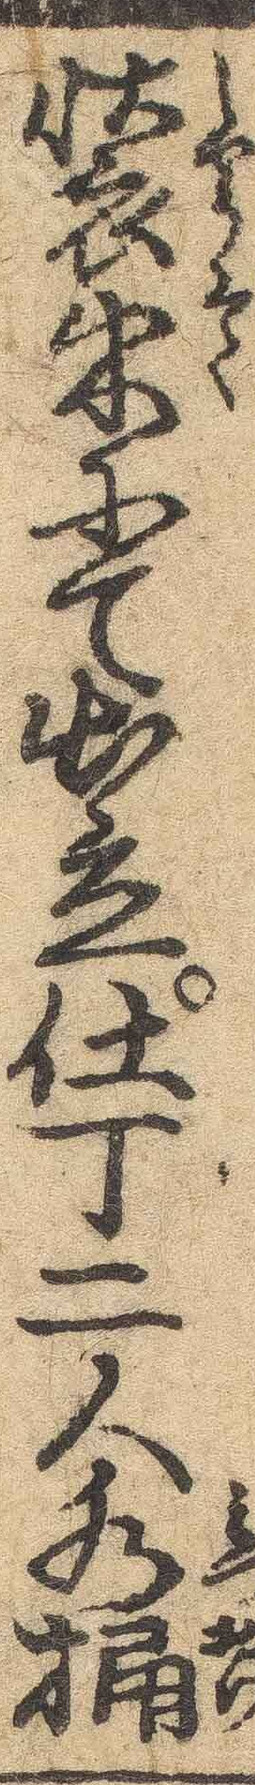装束にて出立。仕丁二人水桶
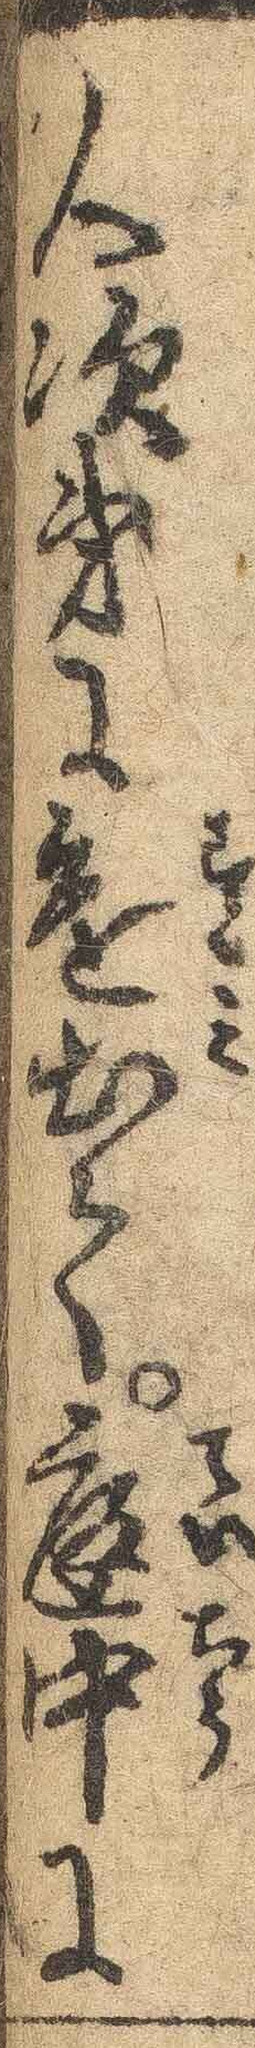人次第に進出て。庭中に
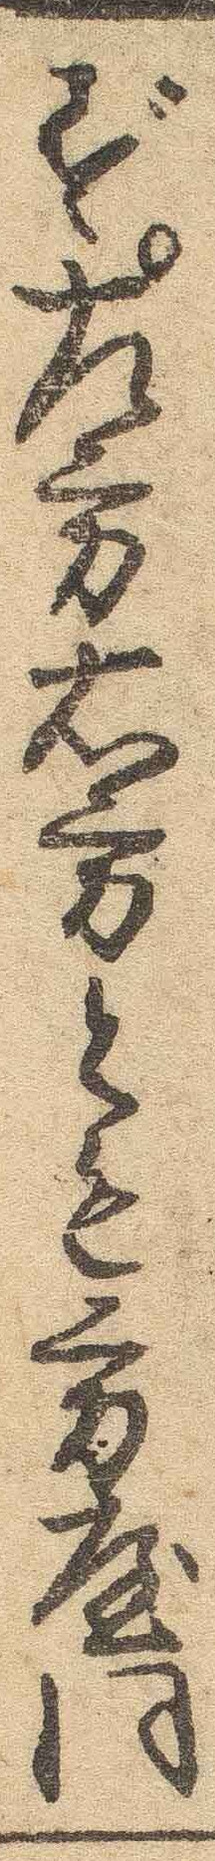ず。左方右方とも方屋同
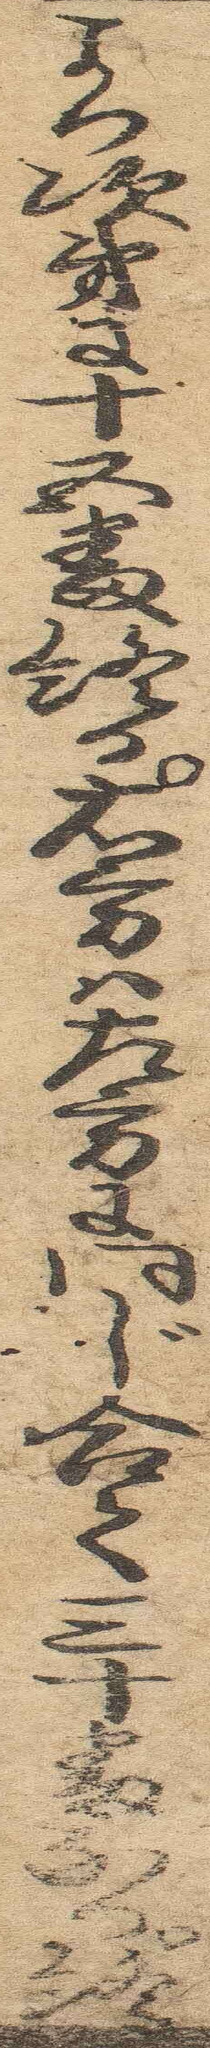より次第に十五番終る。右方は左方に同じ合て三十番なり。終
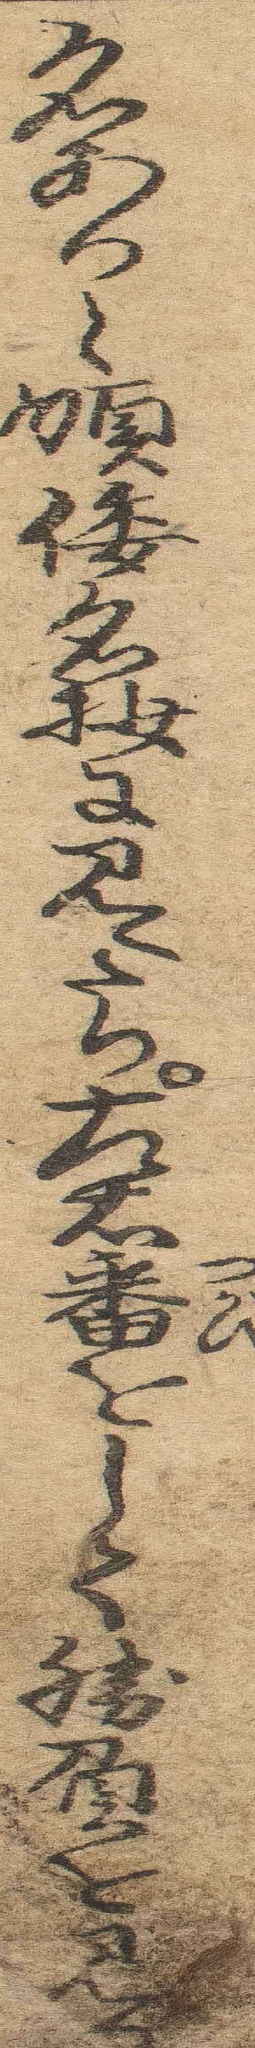名ありと順倭名抄に見へたり。左右番をして勝負見る
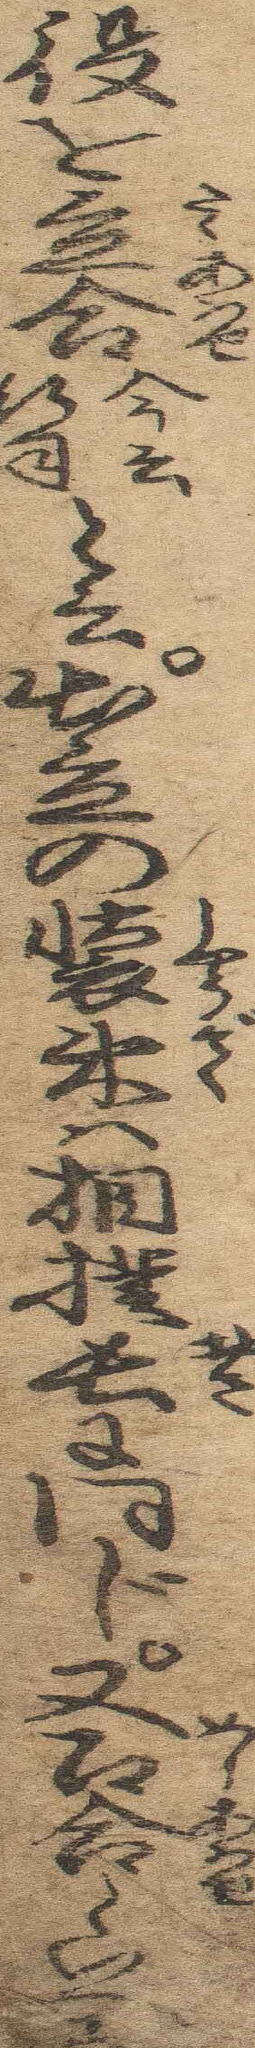役を立合今云行司と云。出立の装束は相撲長に同じ。又召合といへるは

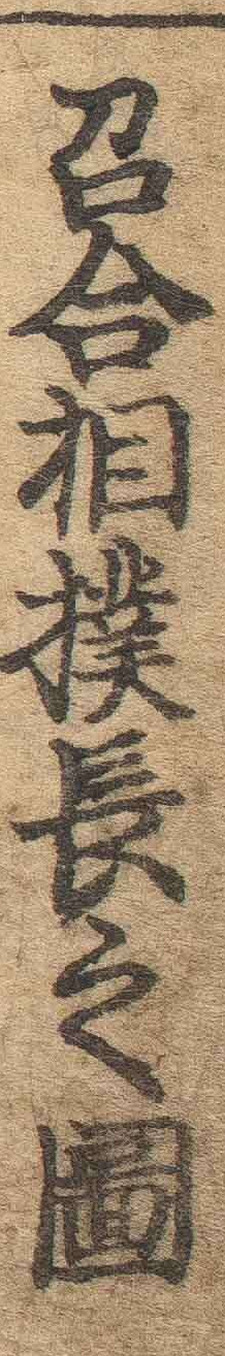召合相撲之図
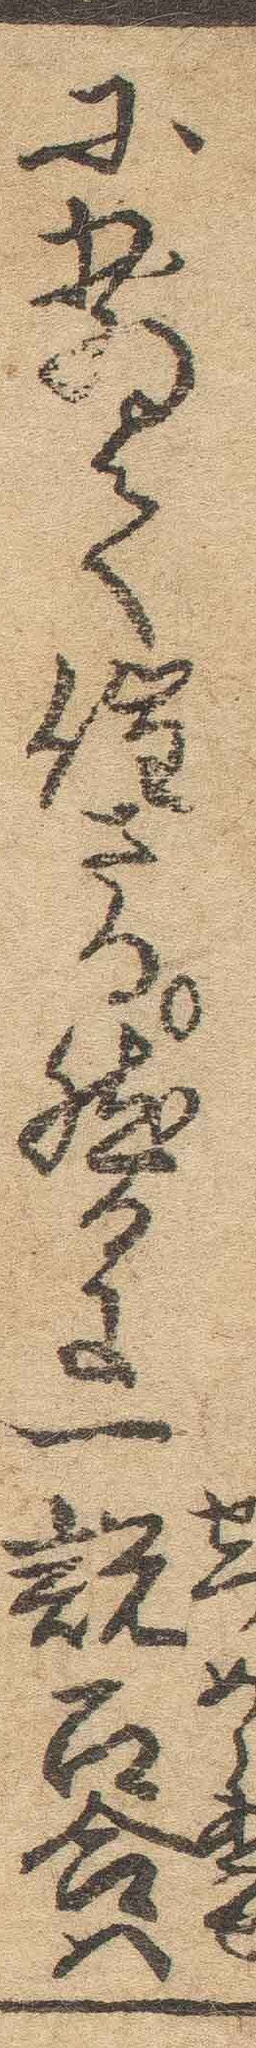におゐて催さる。然るに一説召合は
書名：古今相撲大全
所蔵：東京学芸大学附属図書館 国文学研究資料館
